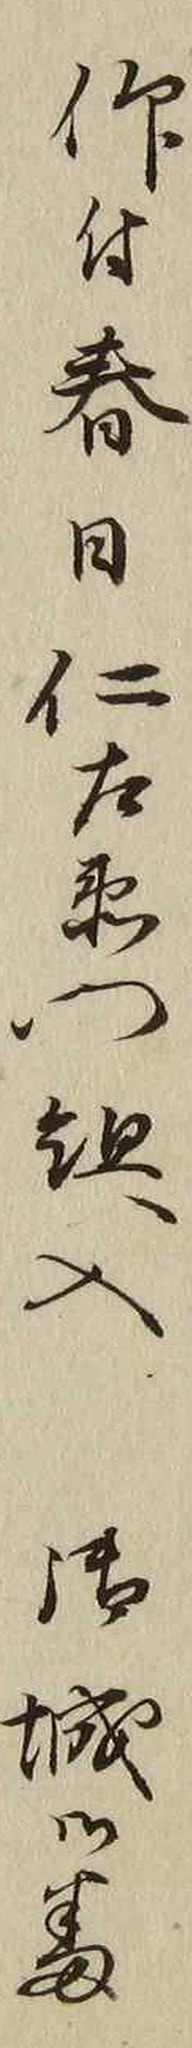仰付春日仁左衛門組へ入御城御番
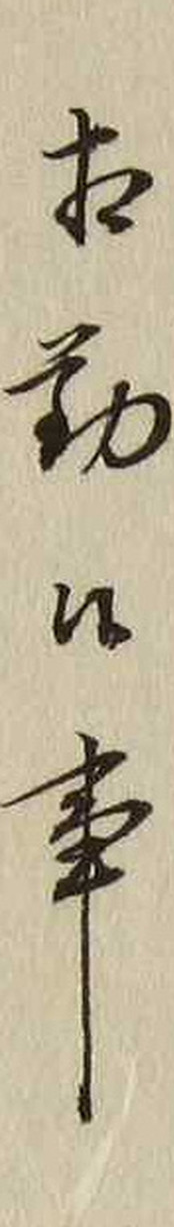相勤候事
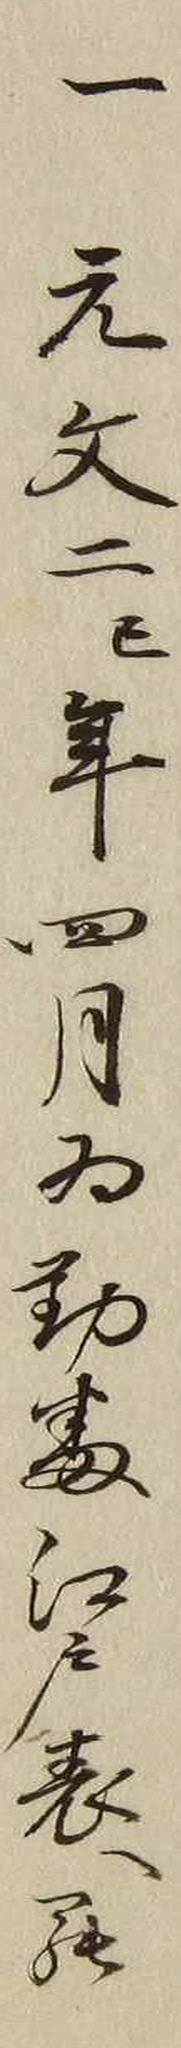一元文二巳年四月為勤番江戸表へ罷
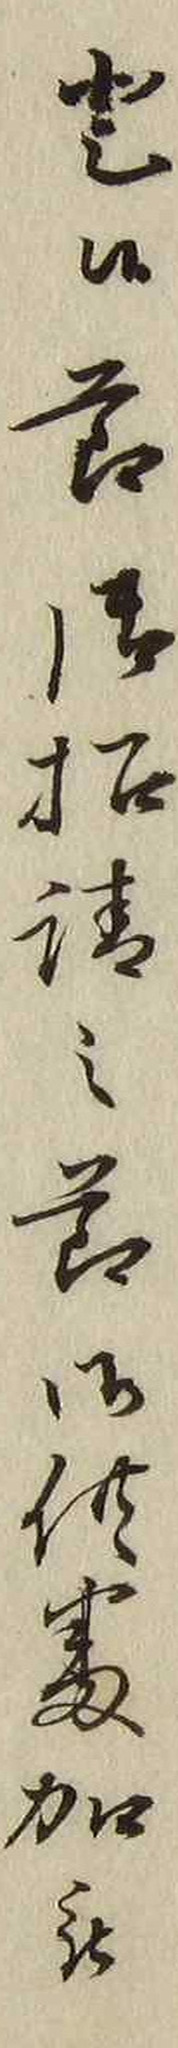登候節御招請之節御供番加被
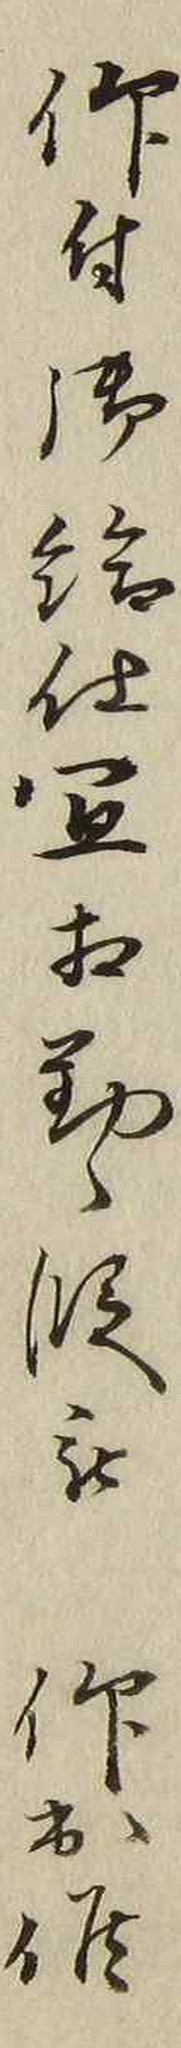仰付御給仕宜相勤候段被仰出候
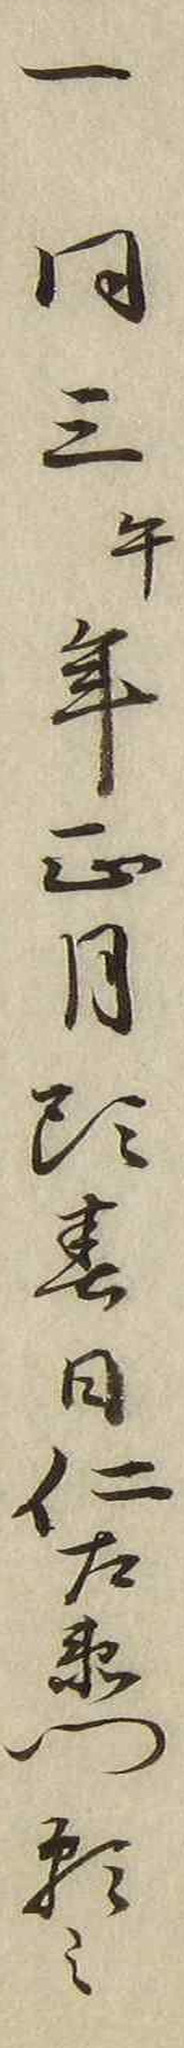一同三午年正月頭春日仁左衛門願之

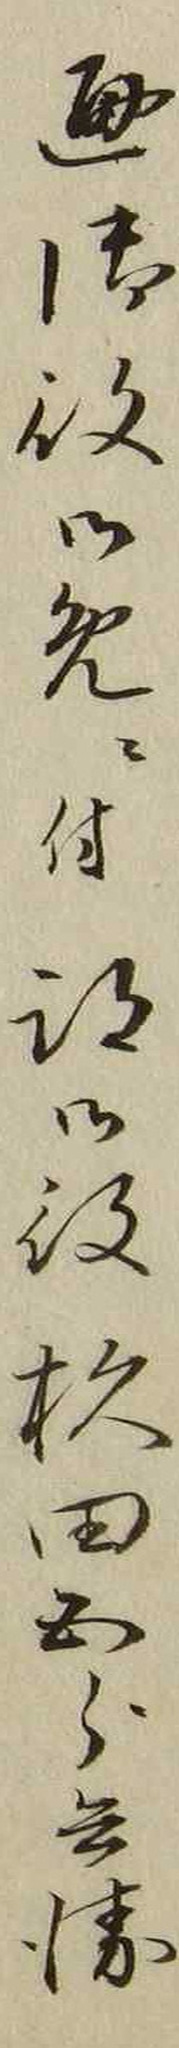通御役御免ニ付跡御役杉田五郎兵衛
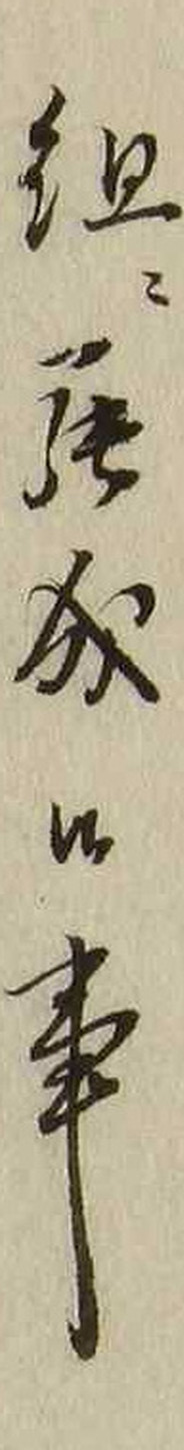組ニ罷成候事
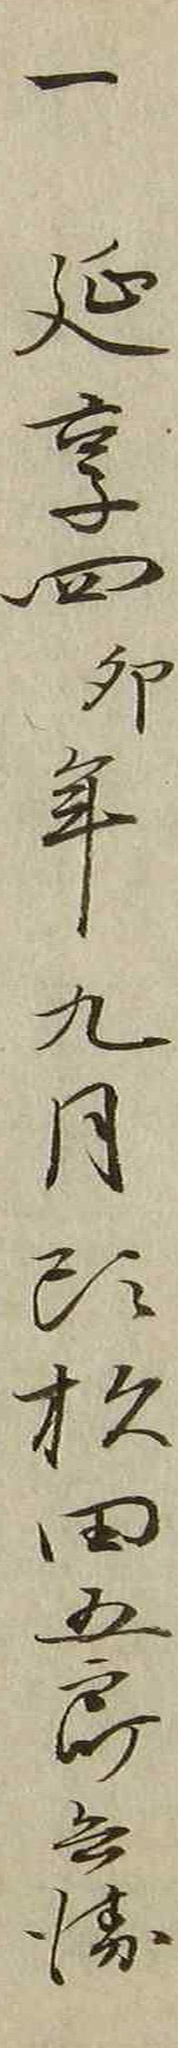一延享四卯年九月頭杉田五郎兵衛
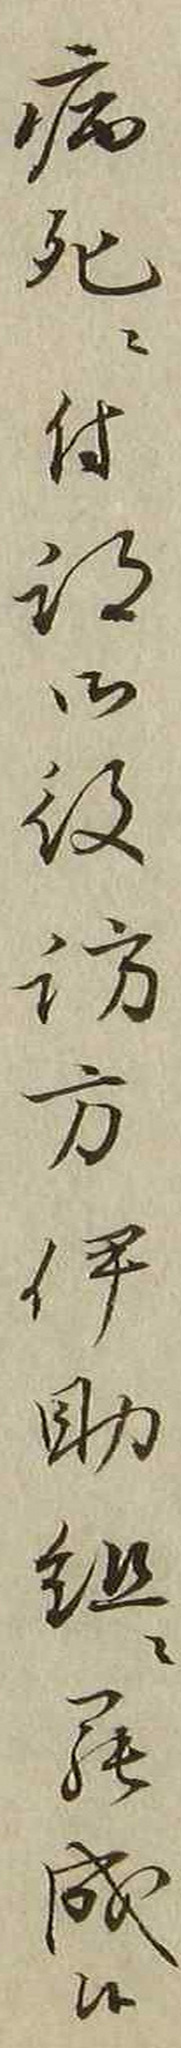病死ニ付跡御役訪方伊助組ニ被罷成候
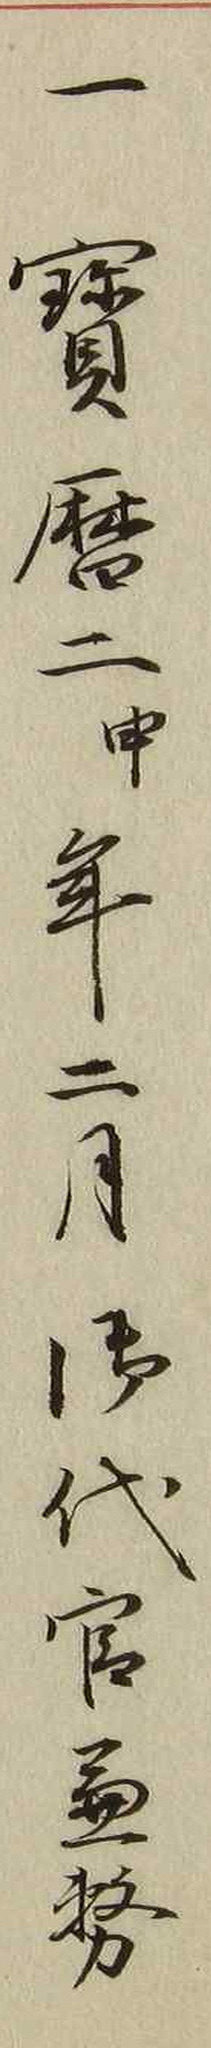一宝暦二申年二月御代官兼務
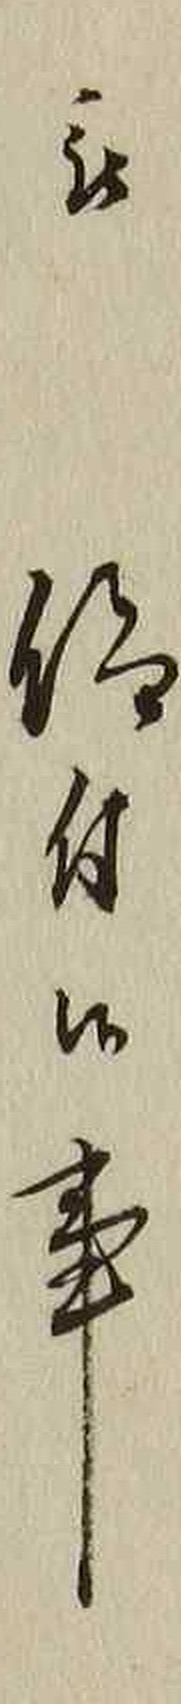被仰付候事
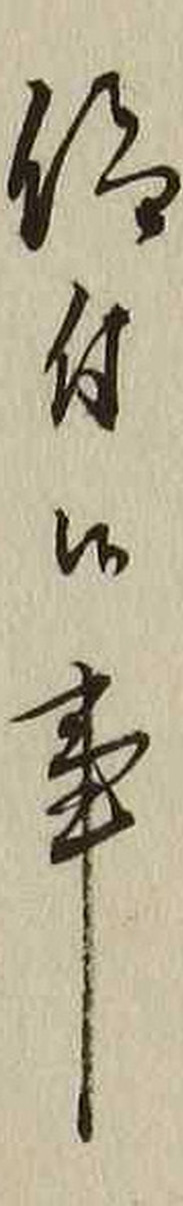仰付候事
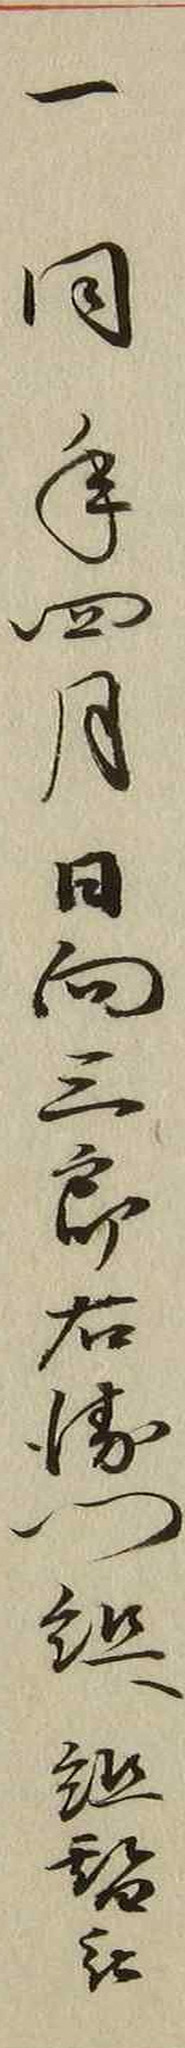一同年四月日向三郎右衛門組へ組替被
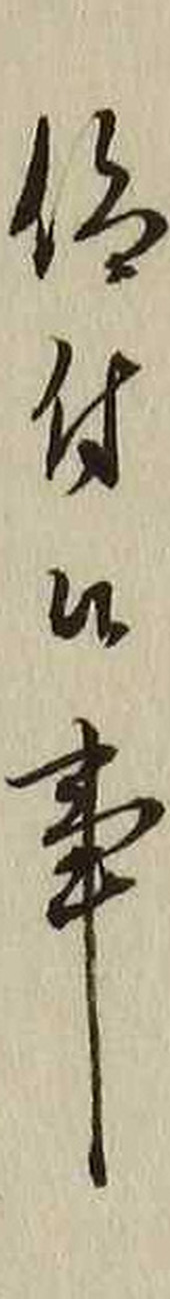仰付候事
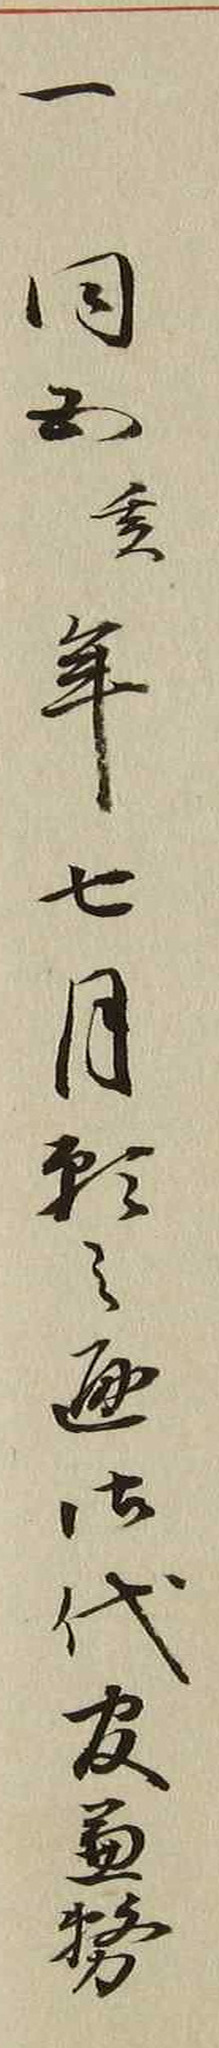一同五亥年七月願之通御代官兼務
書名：諸士系譜　巻之22　い之部22
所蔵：会津若松市立会津図書館
